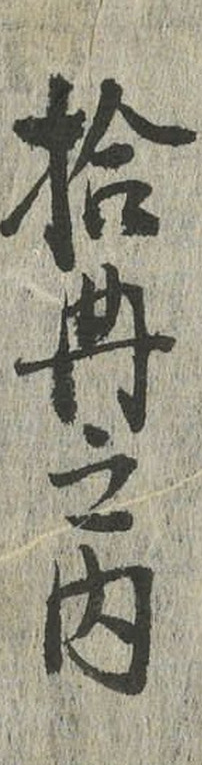拾冊之内
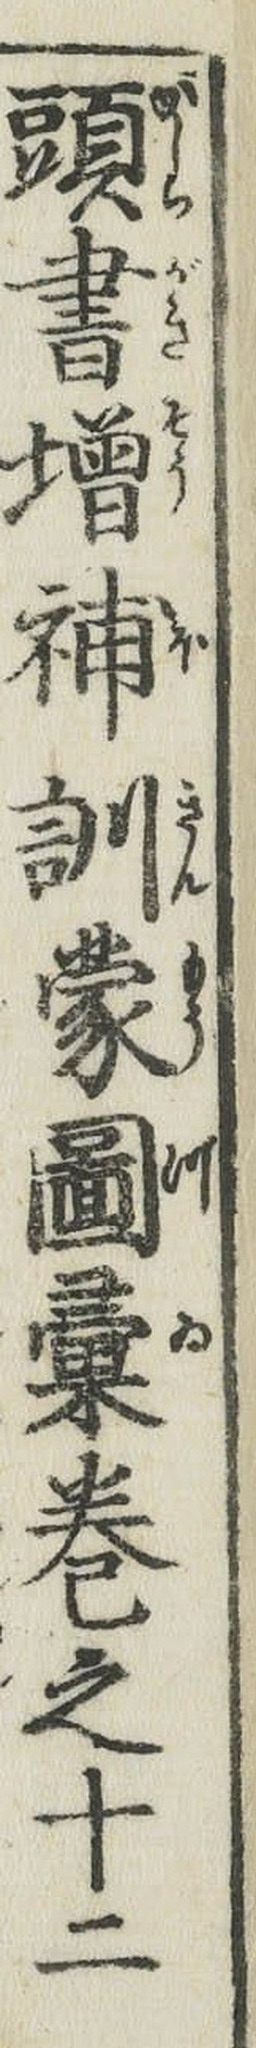頭書増補訓蒙図彙巻之十二
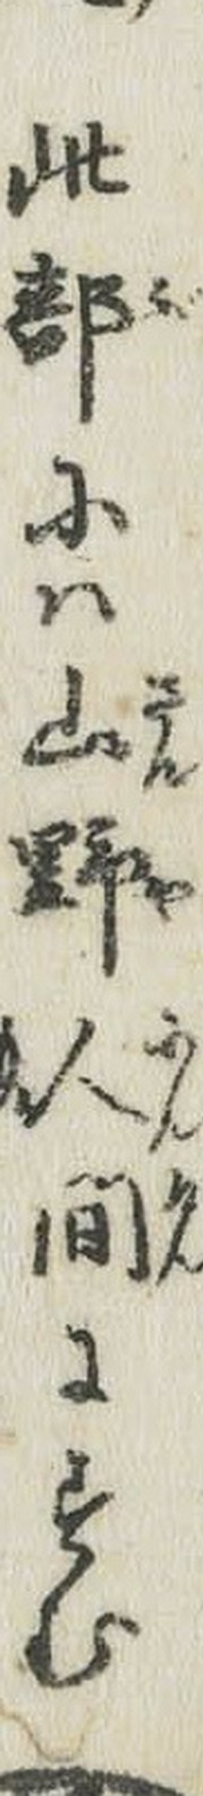此部には山野人間にすむ
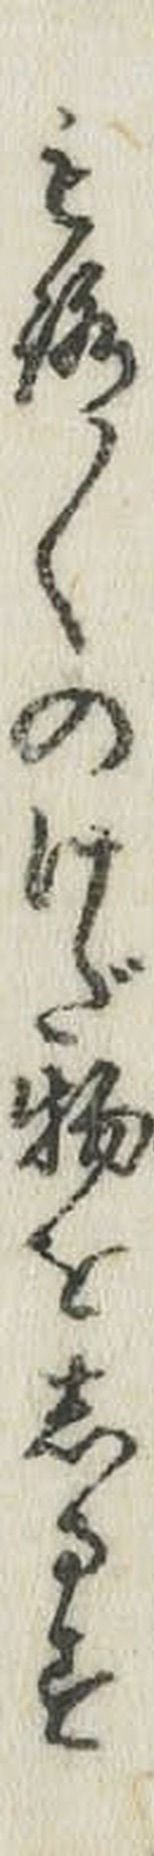もろ〳〵のけだ物をしるす
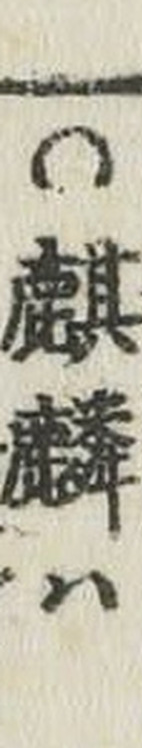○麒麟は
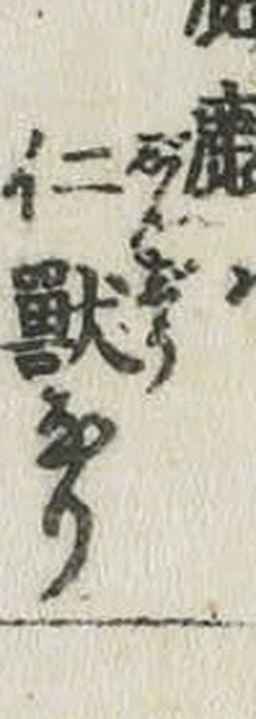仁獣なり
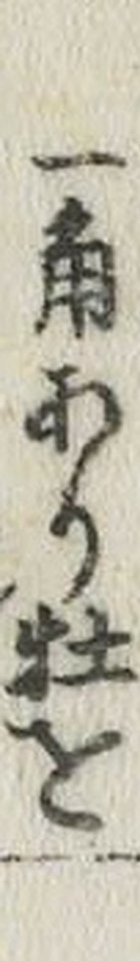一角あり牡を
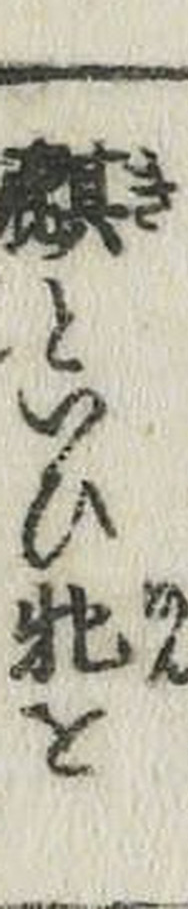麒といひ牝を
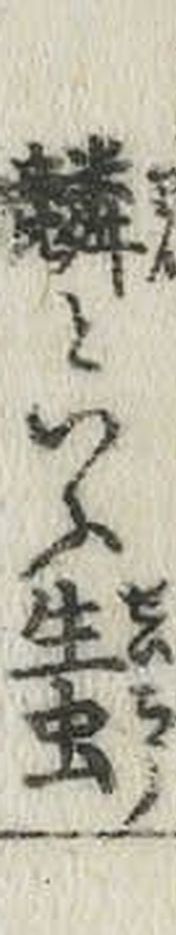麟といふ生虫
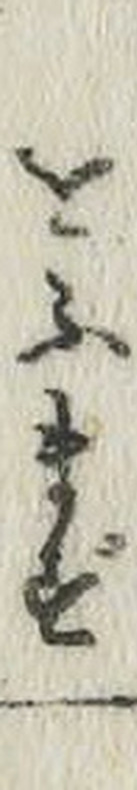をふまず
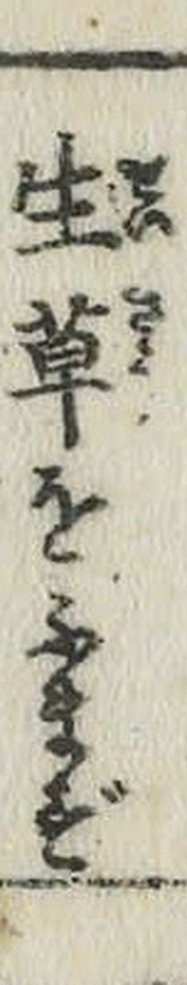生草をふまず
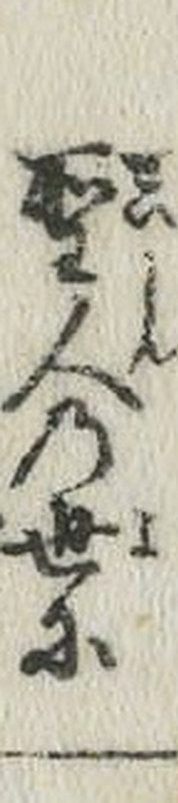聖人の世に
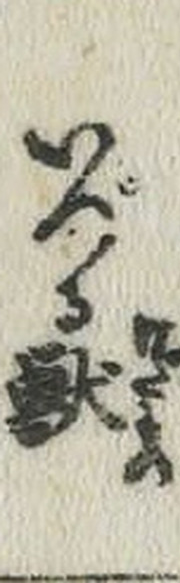いつる獣

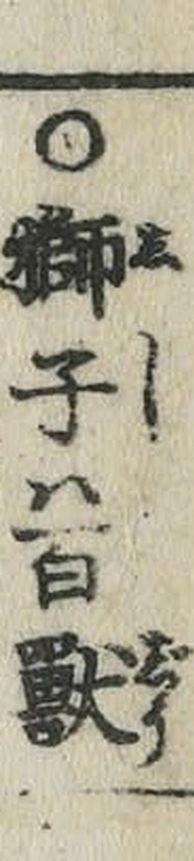○獅子は百獣
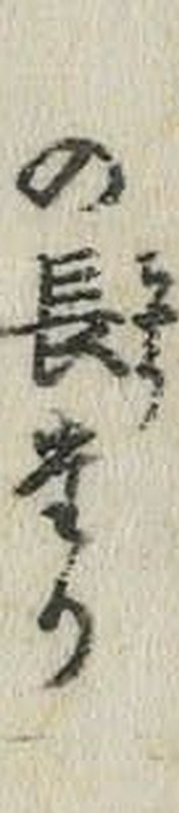の長なり
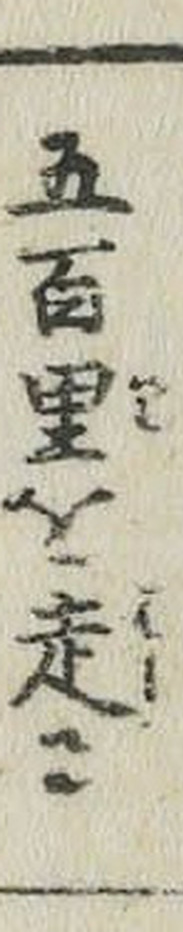五百里を走る
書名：増補頭書訓蒙図彙大成 10巻 6:巻之12-13
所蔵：東京学芸大学教育コンテンツアーカイブ
